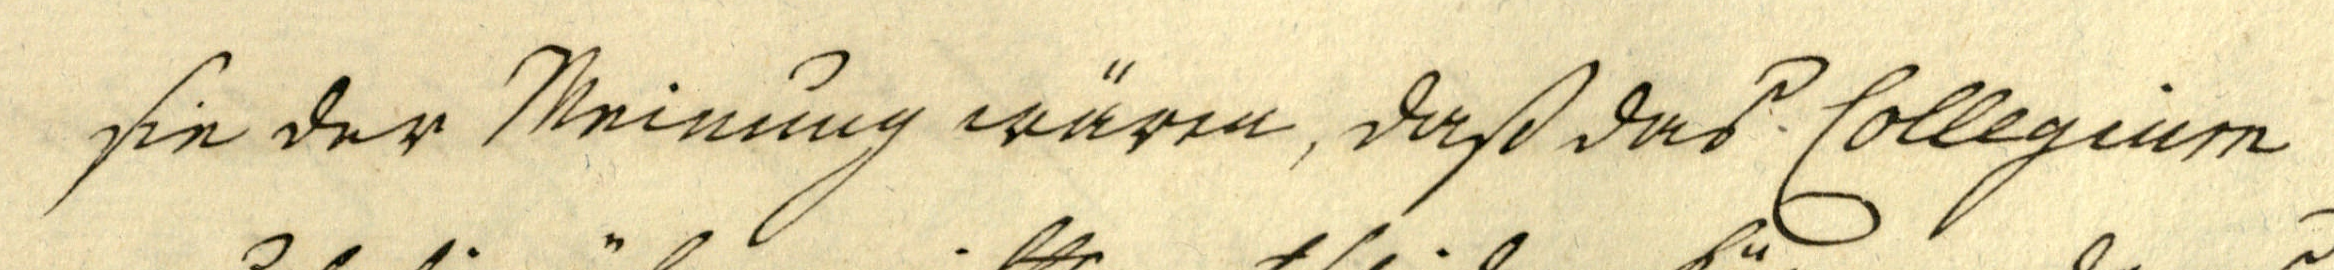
sie der Meinung wären, daß das Collegium
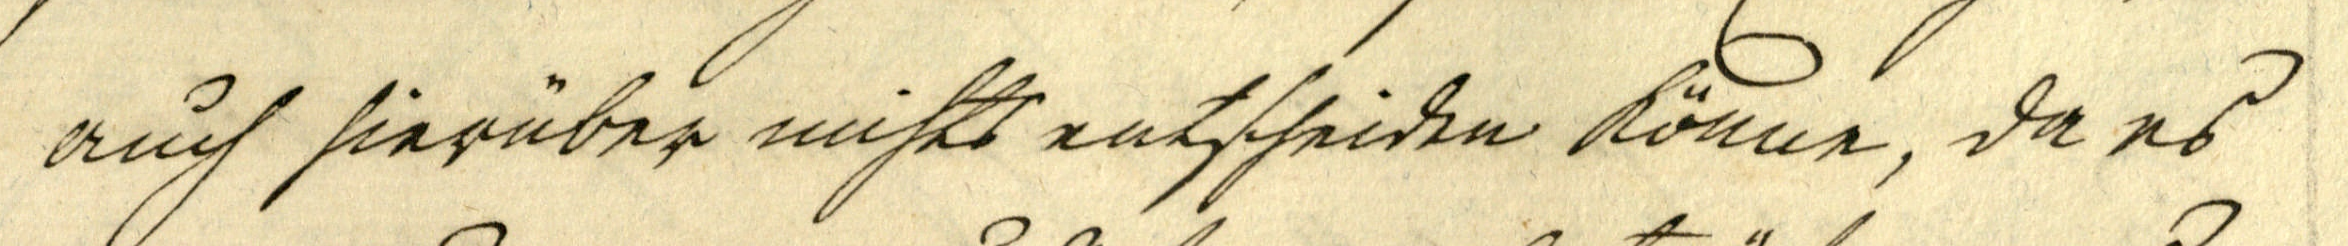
auch hierüber nichts entscheiden könne, da es
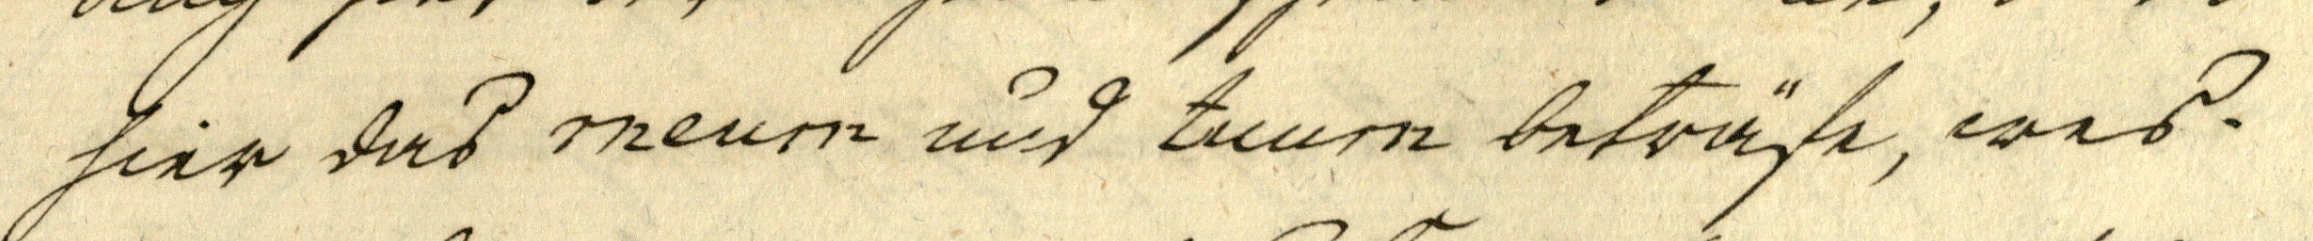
hier das meum und tuum beträfe, wes¬
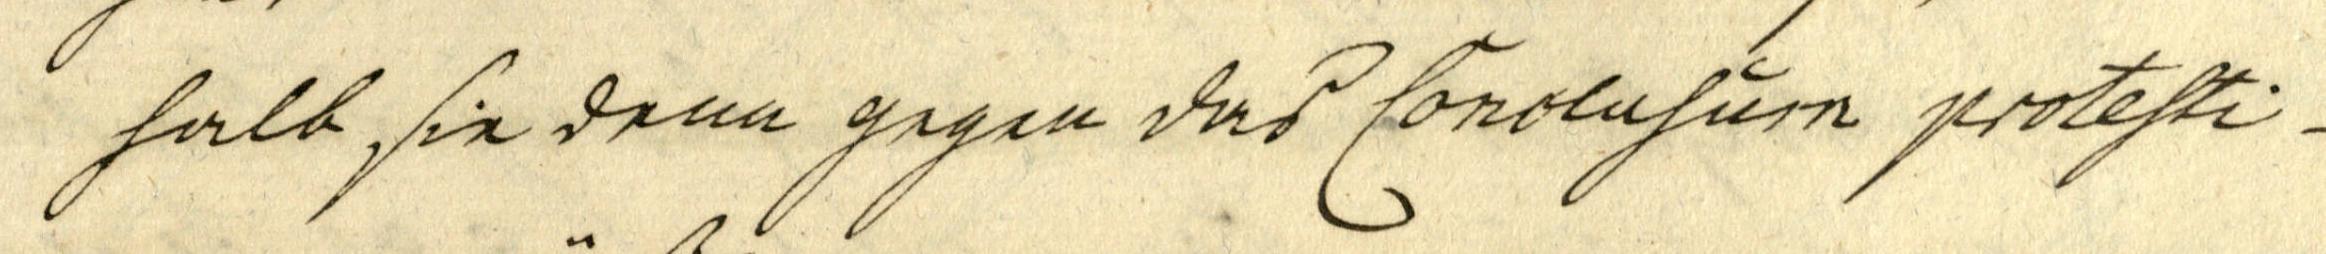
halb sie denn¬ gegen das Conclusum protesti
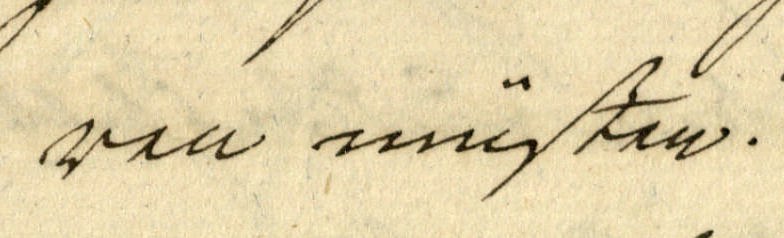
ren müßten.
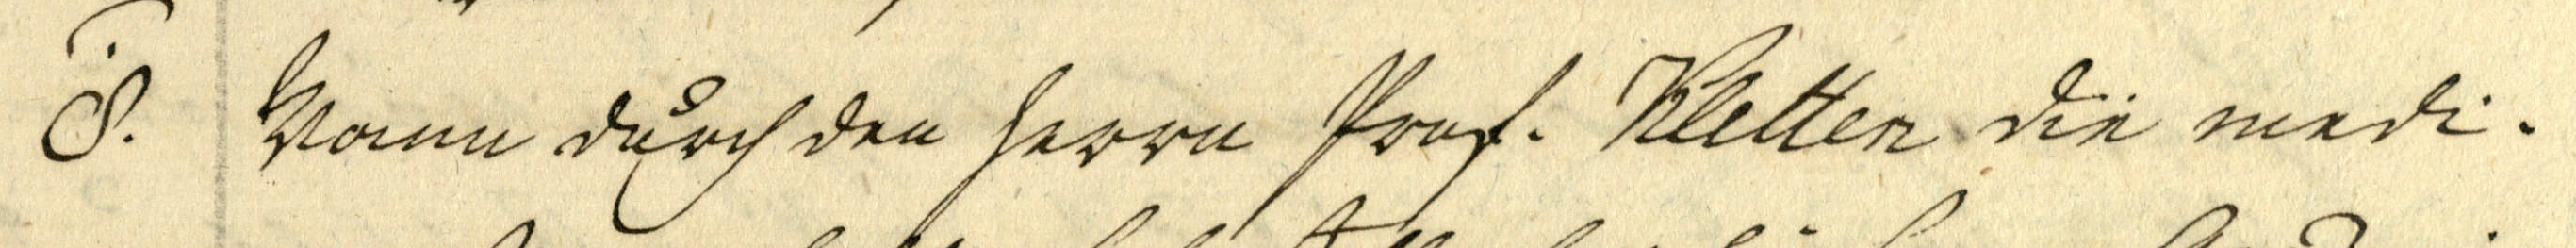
8. Wann durch den Herrn Prof. Kletten. die medi¬
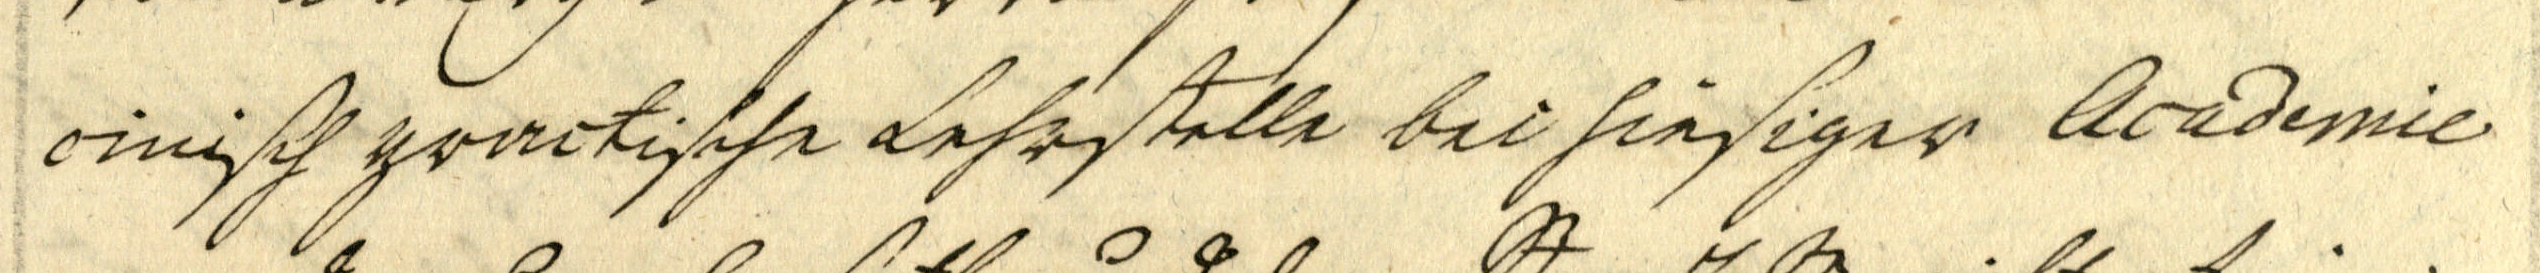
cinisch practischen Lehrstelle bei hiesiger Academie
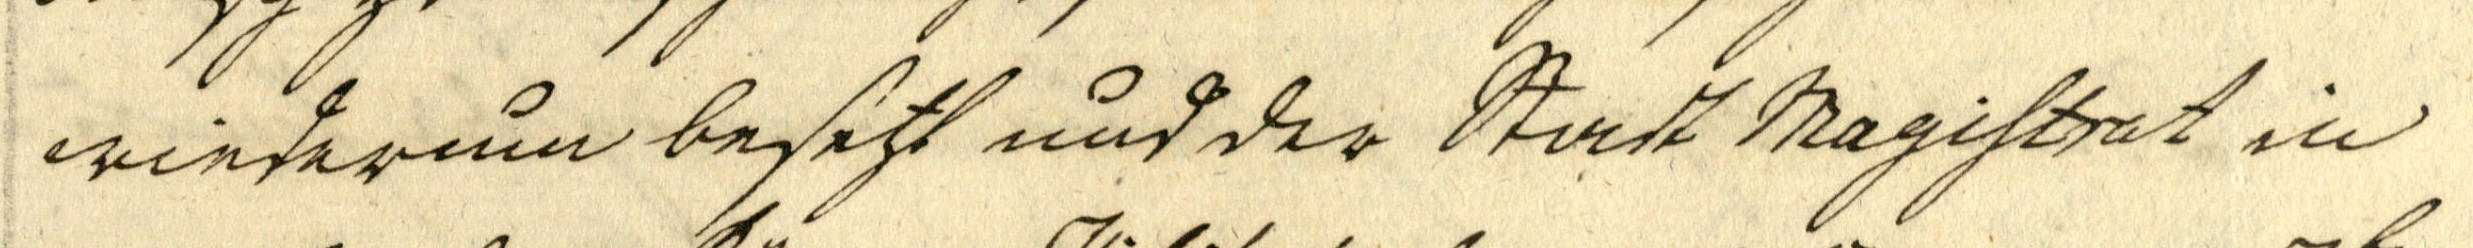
wiederum besetzt und der Stadt Magistrat in
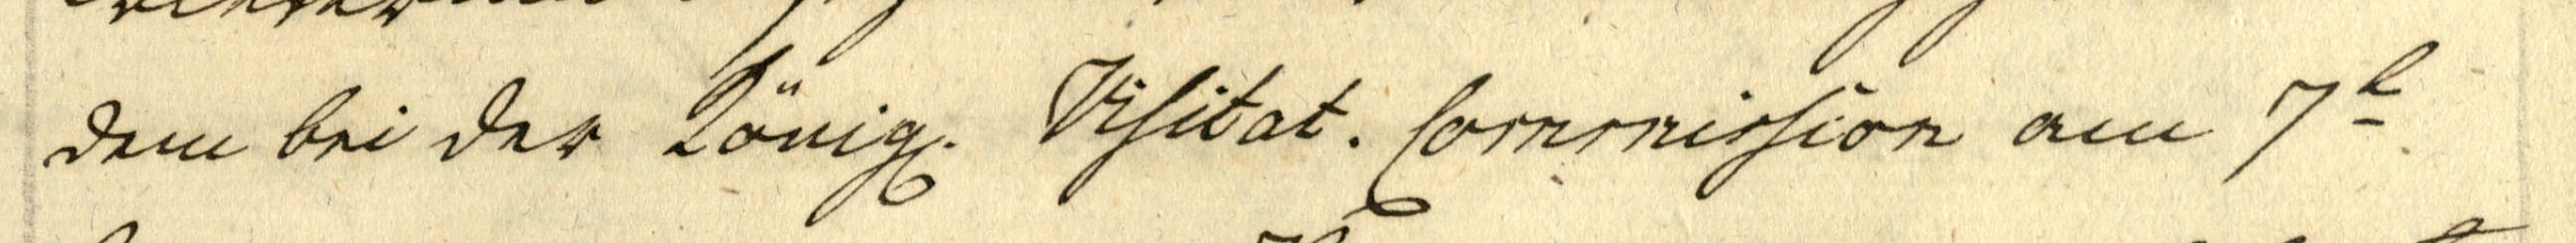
dem bei der Königl. Visitat. Commission am 7 t
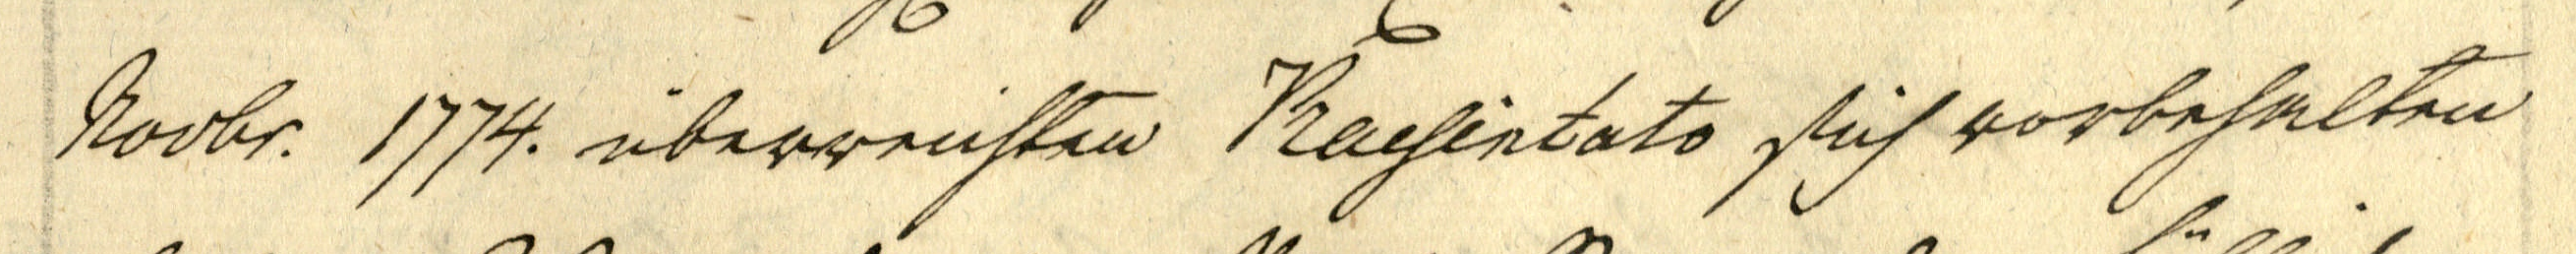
Novbr. 1774. überreichten Praesentato sich vorbehalten
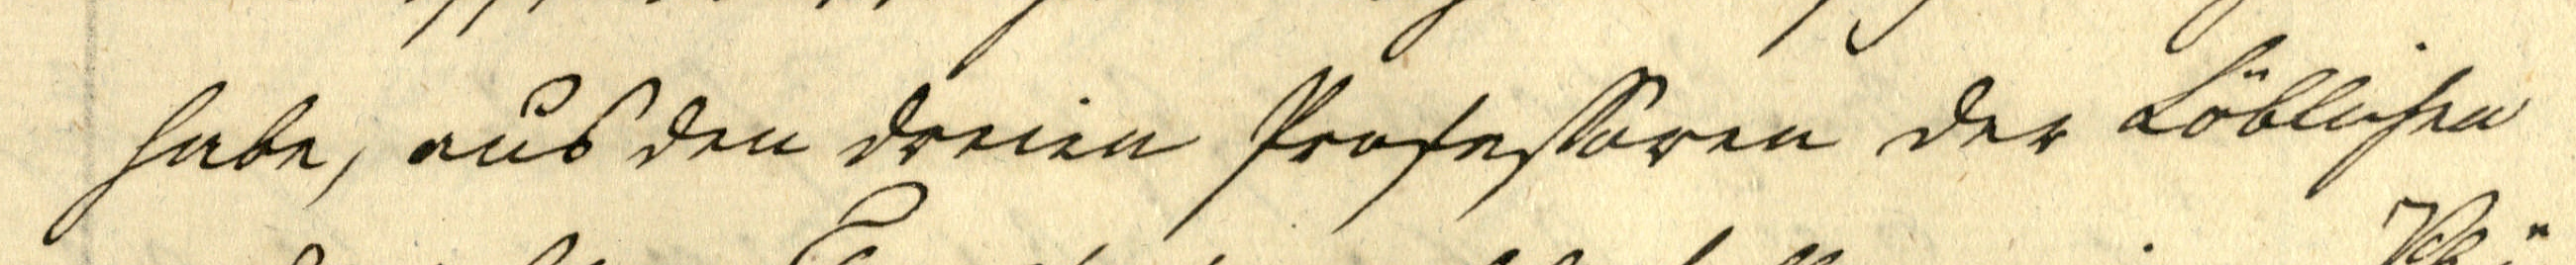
habe, aus den dreien Professoren der Löblichen
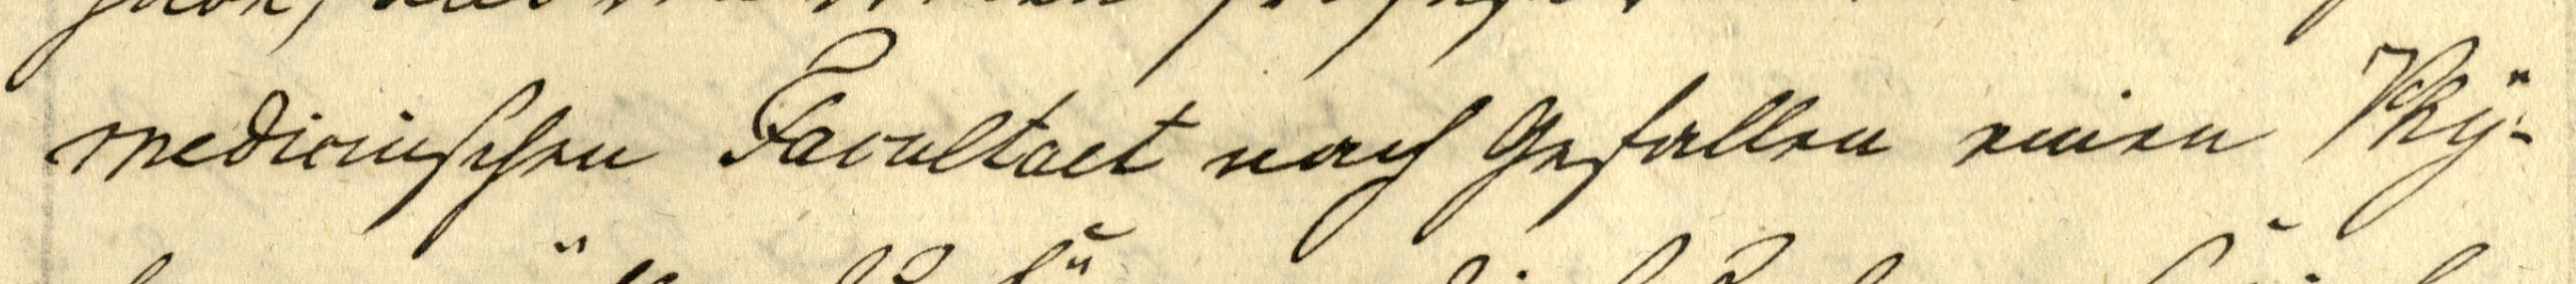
medicinischen Facultaet nach Gefallen einen Phÿ¬
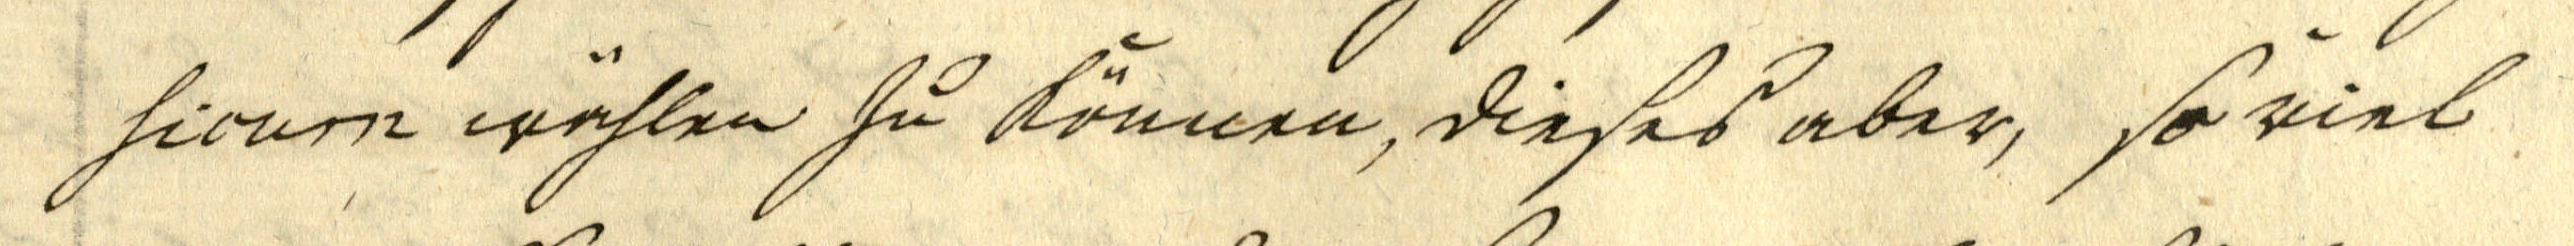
sicum wählen zu können, dieses aber, so viel
